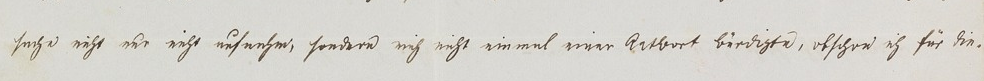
sache nicht nur nicht aufnahm, sondern mich nicht einmal einer Antwort würdigte, obschon ich für die-
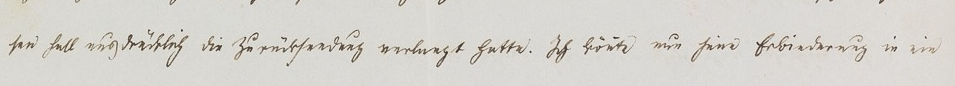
sen Fall ausdrücklich die Zurücksendung verlangt hatte. Ich könnte nun jene Erwiederung in ein
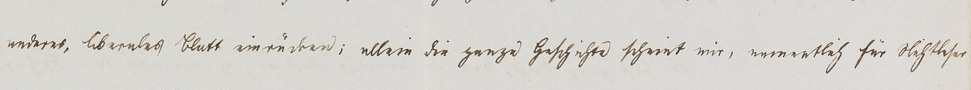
anderes, liberales Blatt einrücken; allein die ganze Geschichte scheint mir, namentlich für Nichtleser
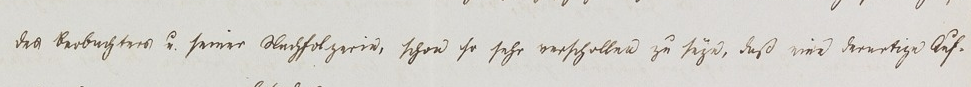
des Beobachters u. seiner Nachfolgerin, schon so sehr verschollen zu seyn, daß eine derartige Auf-
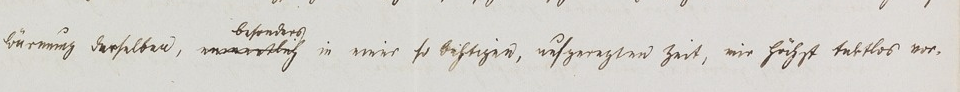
wärmung derselben, namentlichbesonders in einer so wichtigen, aufgeregten Zeit, mir höchst taktlos vor-
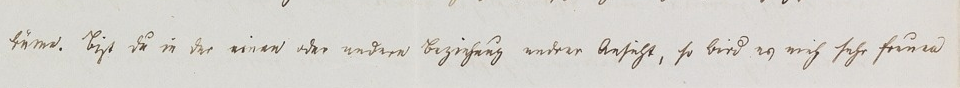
käme. Bist du in der einen oder andern Beziehung andrer Ansicht, so wird es mich sehr freuen
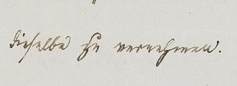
dieselbe zu vernehmen.
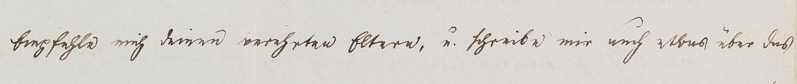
Empfehle mich deinen verehrten Eltern, u. schreibe mir auch etwas über das
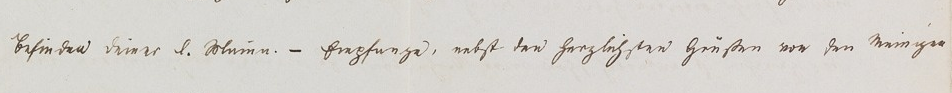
Befinden deiner l. Mamma. – Empfange, nebst den herzlichsten Grüßen von den Meinigen
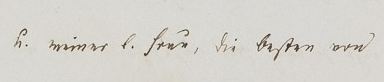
u. meiner l. Frau, die besten von
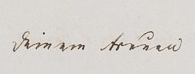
deinem treuen
